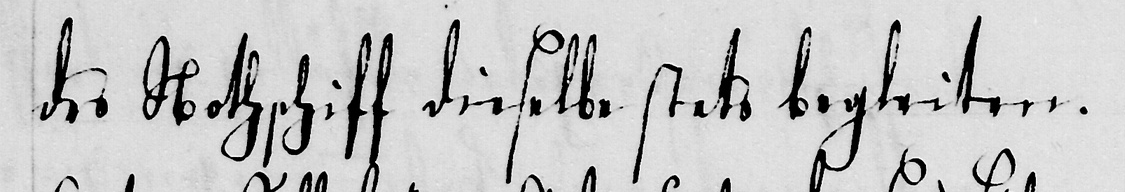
des Nothschiff dieselbe stets begleiten.
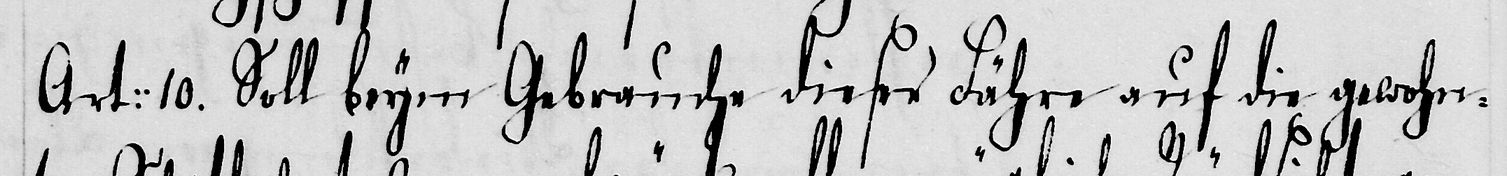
Art: 10. Soll beym Gebrauche dieser Fähre auf die gewohn¬
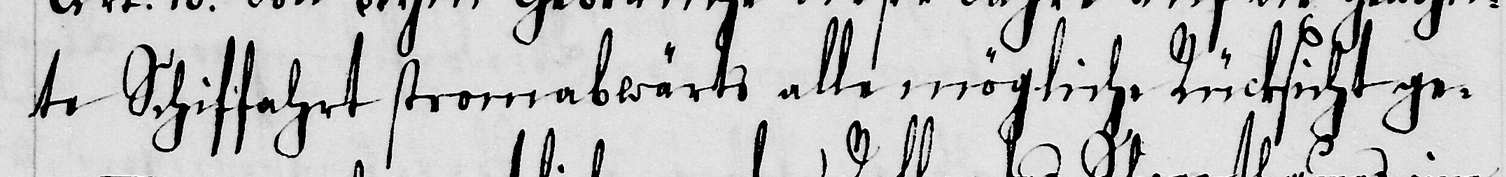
te Schiffahrt stromabwärts alle mögliche Rücksicht ge¬
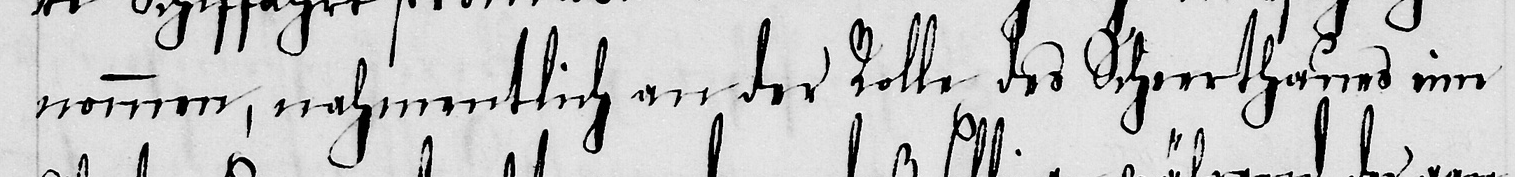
nommen, nahmentlich an der Rolle des Scheerthaues eine
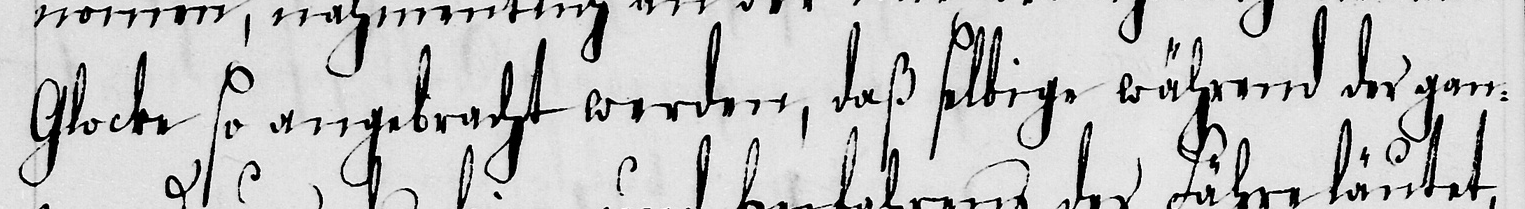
Glocke so angebracht werden, daß selbige während der gan¬
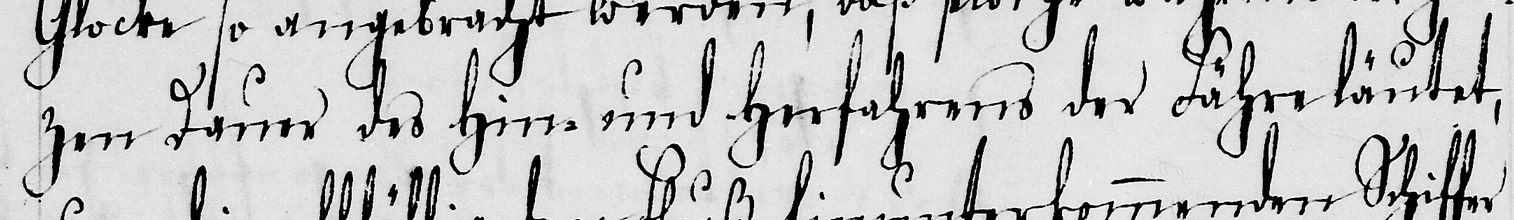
zen Dauer des Hin- und Herfahrens der Fähre läutet,
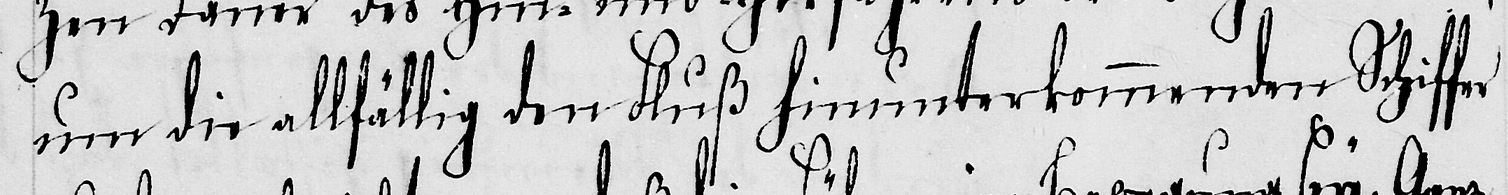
um die allfällig den Fluß hinunterkommenden Schiffer
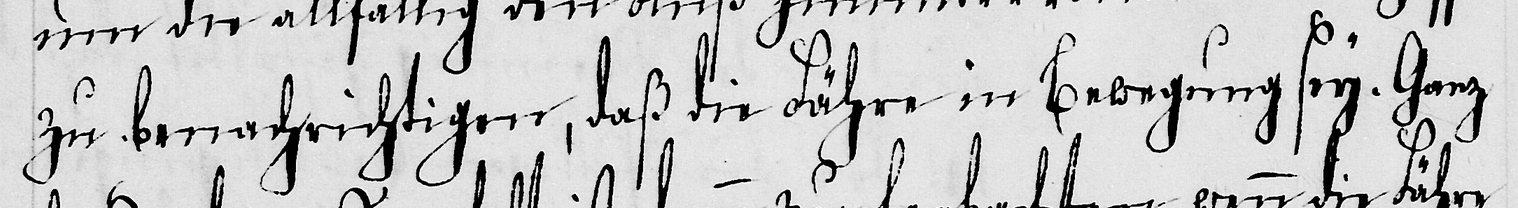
zu benachrichtigen, daß die Fähre in Bewegung sey. Ganz
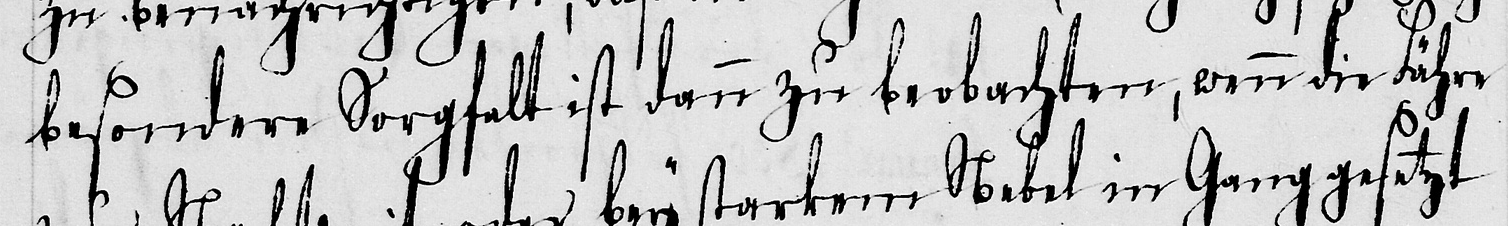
besondere Sorgfalt ist dann zu beobachten, wenn die
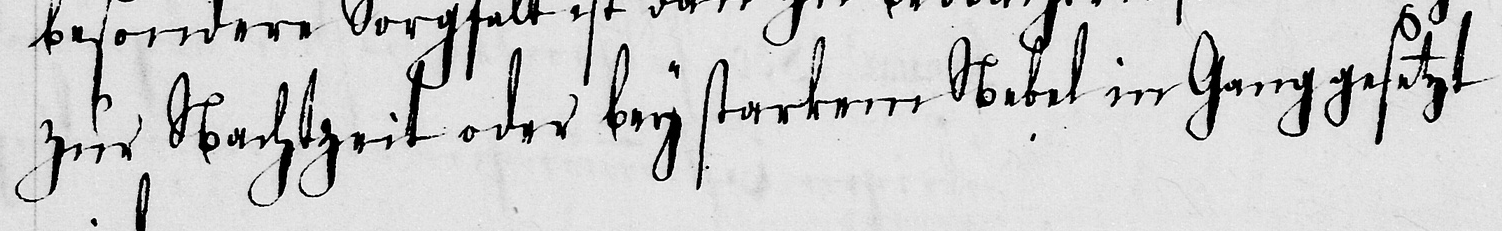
zur Nachtzeit oder bey starkem Nebel in Gang gesetzt
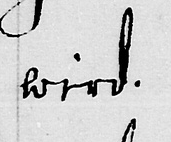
wird.
